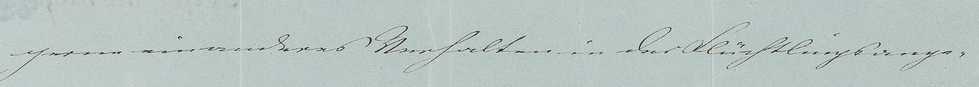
gerne ein anderes Verhalten in der Flüchtlingsange-
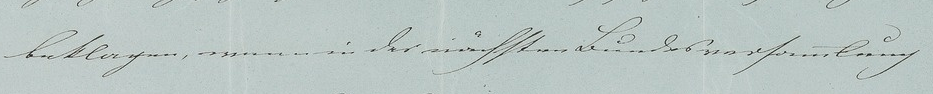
beklagen, wenn in der nächsten Bundesversammlung
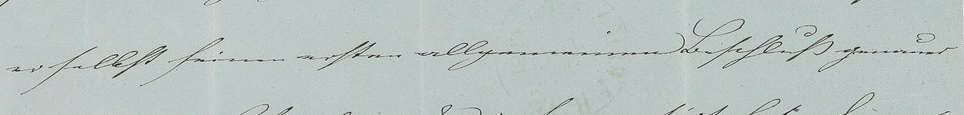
er selbst seinen ersten allgemeinen Beschluß genauer
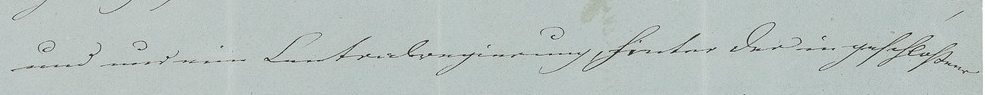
und nur eine Centralregierung, hinter der in geschloßener
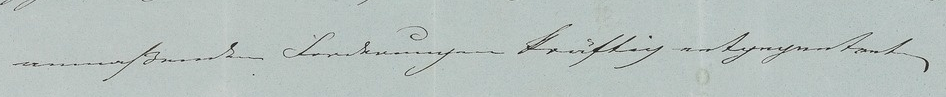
anmaßenden Forderungen kräftig entgegentreten.
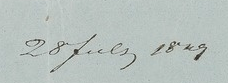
28 July 1849
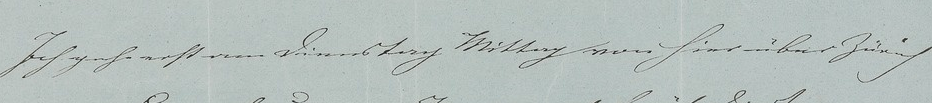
Ich gehe erst am Dienstag Mittag von hier über Zürich
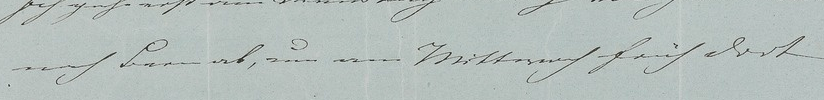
nach Bern ab, um am Mittwoch früh dort
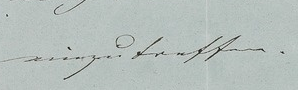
einzutreffen.
